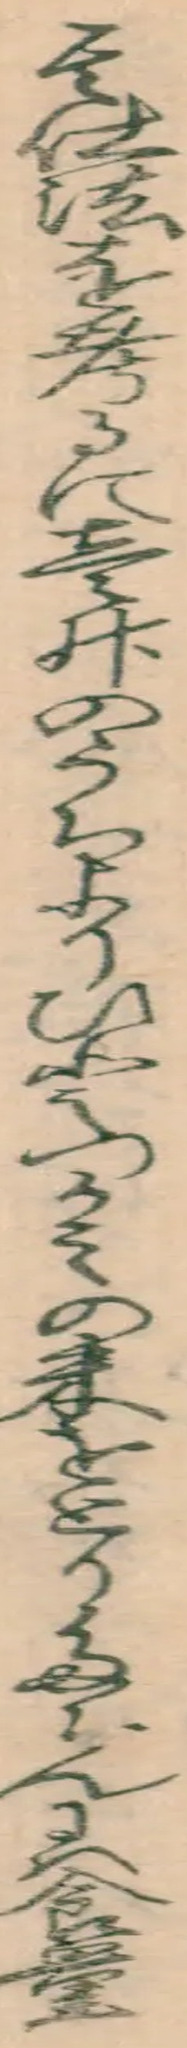其仕法を考るに壱升のうちひとつかみの米をとりたらんには食量
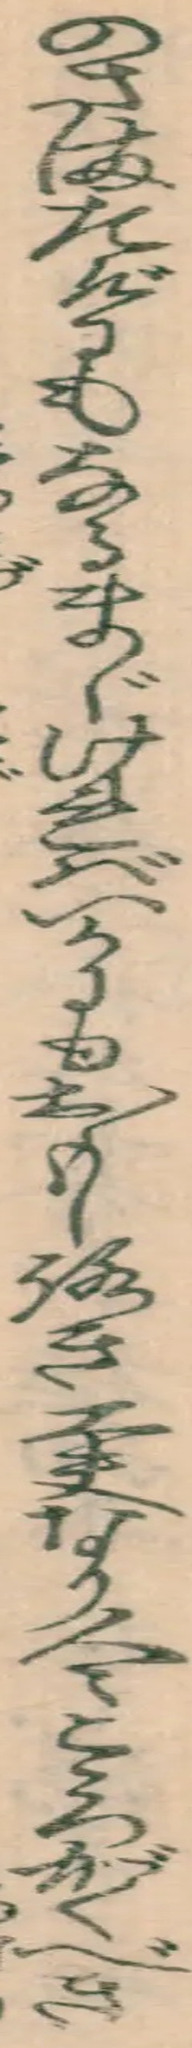のさまたげにもなるまじければいかにもおもしろき工夫なり人々こゝろがくべき事なり
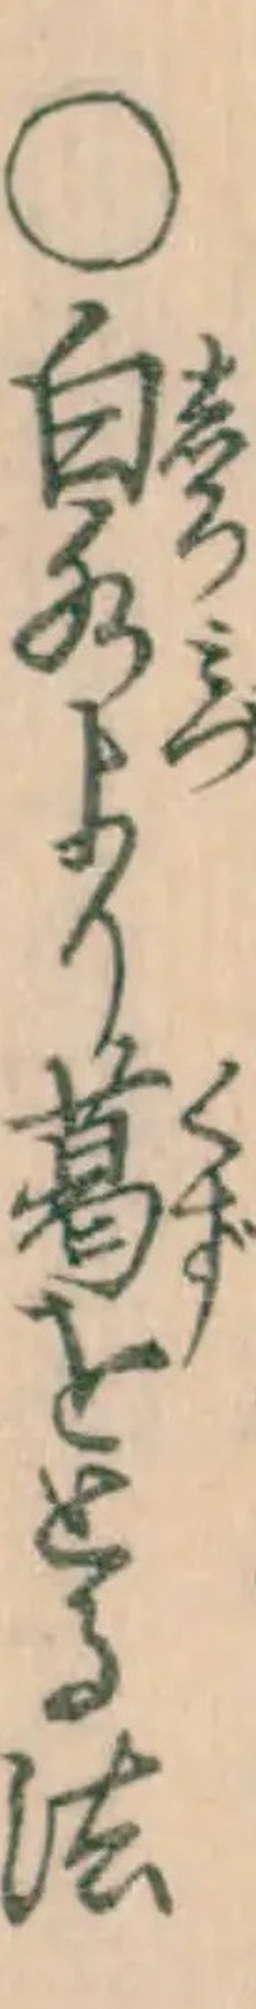○白水より葛をとる法
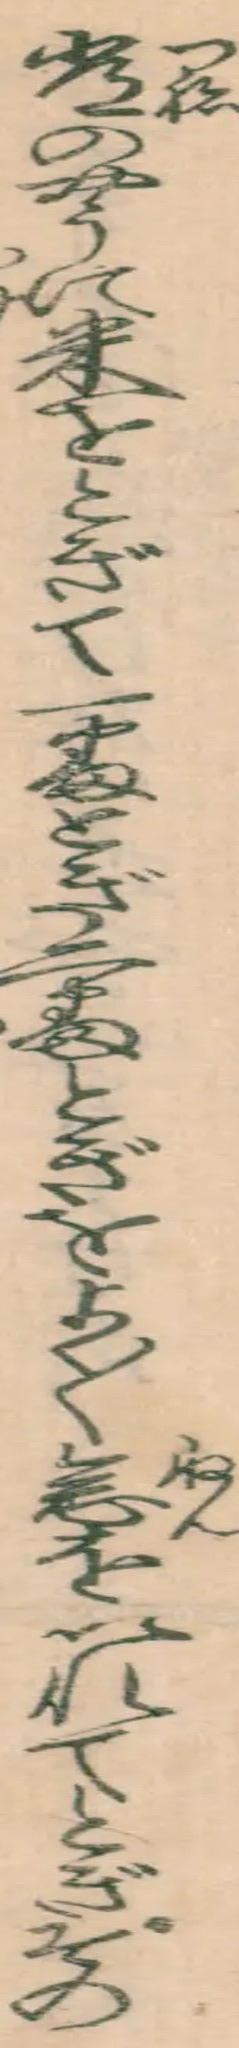常のやうに米をとぎて一番とぎ二番とぎをよく〳〵念をいれてとぎ．その
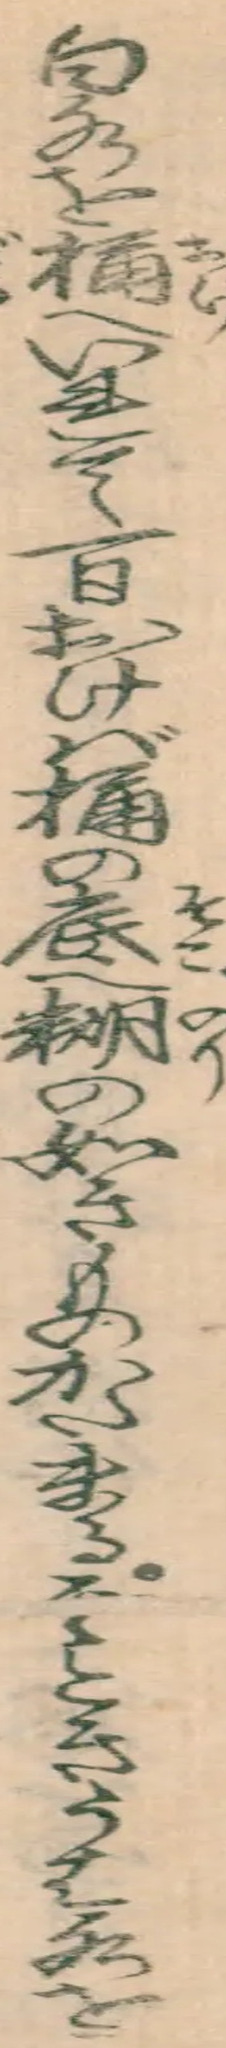白水を桶へいれて一日おけば桶の底へ糊の如きものかたまる．其ときうは水を
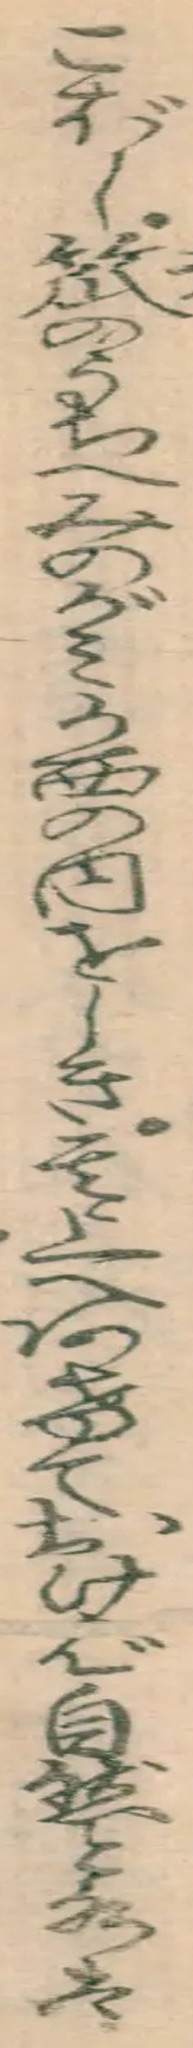こぼし．笊のうちへみのがみか西の内をしき．其上へあけておけば自然と水は
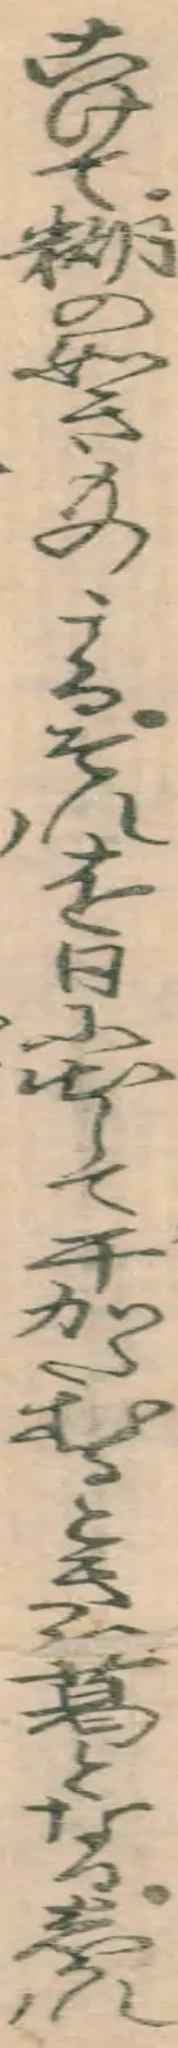こけて．糊の如きものゝこる．それを日に出して干かたむるときは葛となる．しかれ
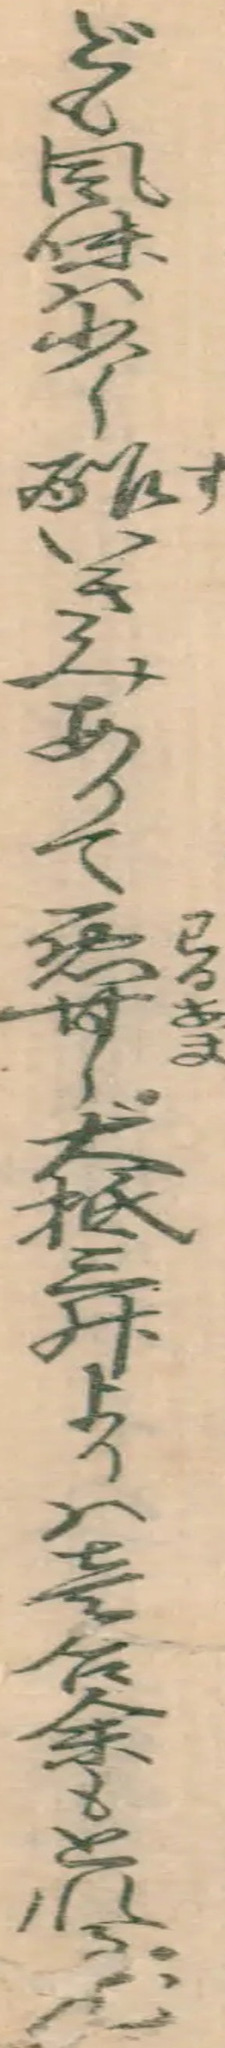ども風味は少し酢いきみありて悪甘し．大抵三升よりは壱合余もとれる．

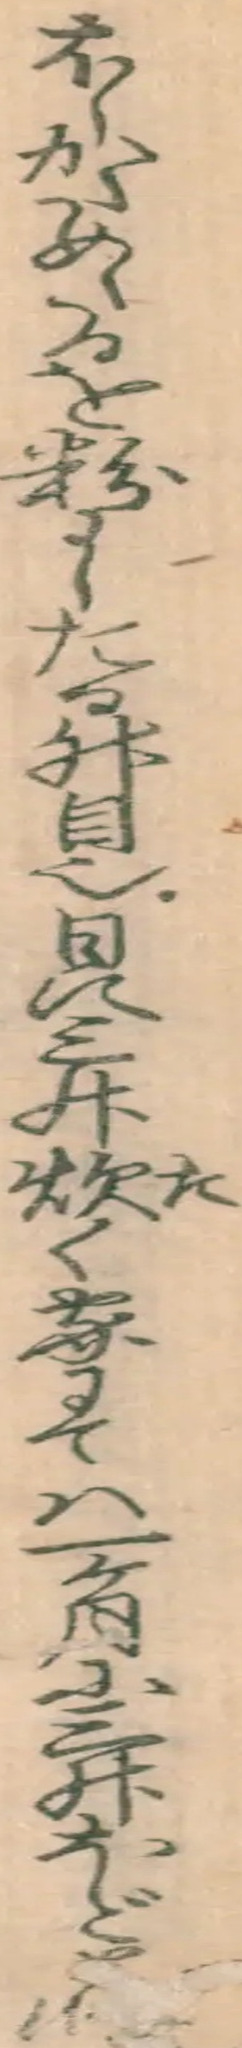ほしかためたるを粉にしたる升目也．日に三升炊く家にては一ヶ月に三升ほどとれる
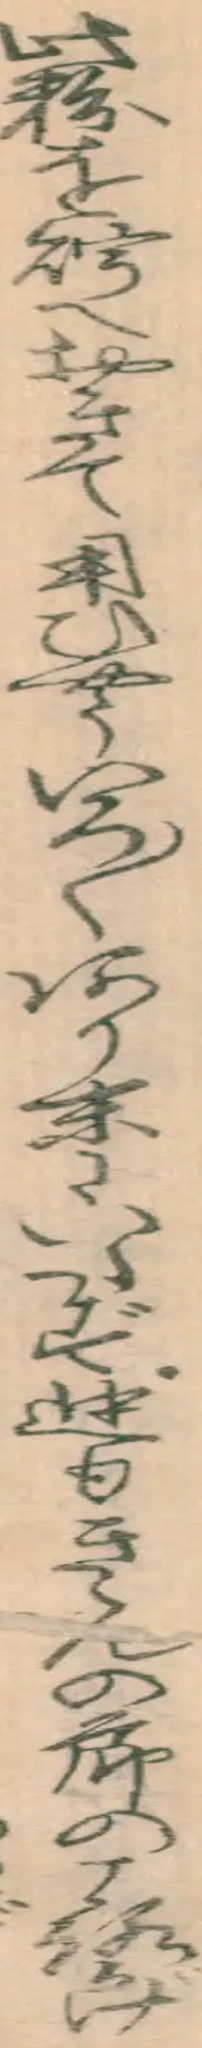此粉を貯へおきて用ひやういろ〳〵あり末にいたず．迚もきゝんの節のこゝろがけ
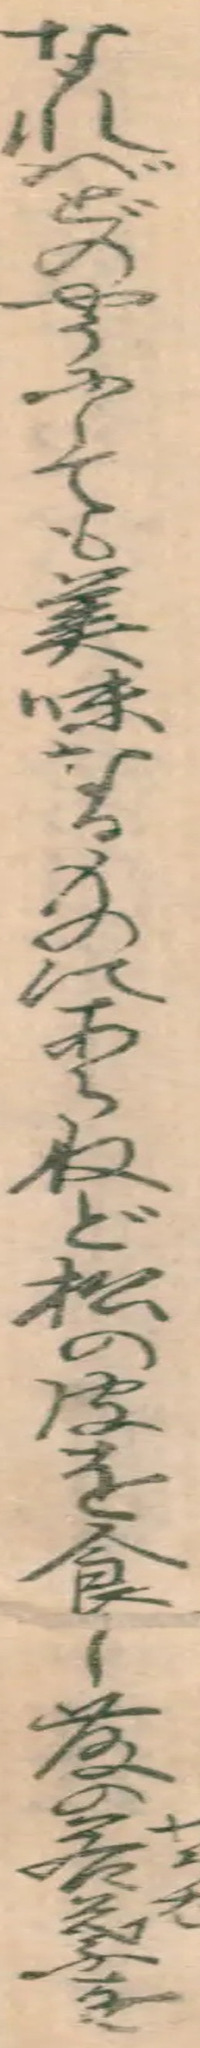なればどのやうにしても美味なるものにあらねど松の皮を食し藤の若葉を
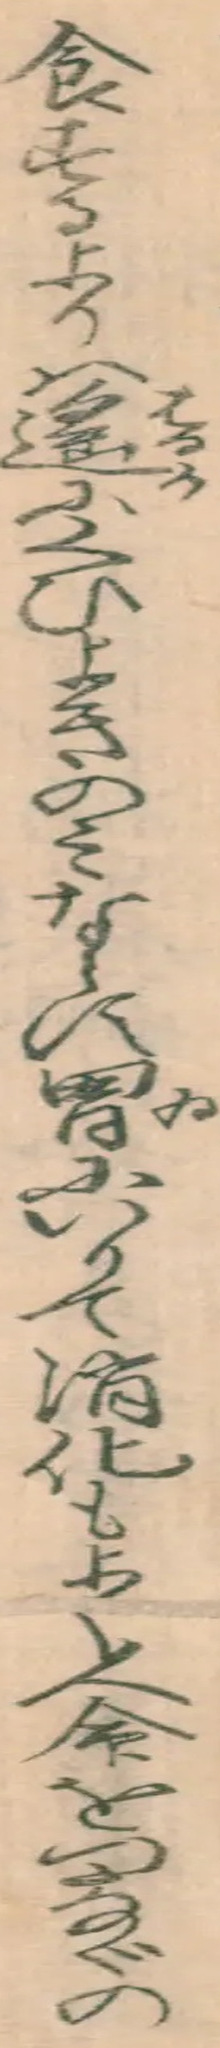食するよりは遥にくひよきのみならす胃にいりて消化もよく人命をつなぐの
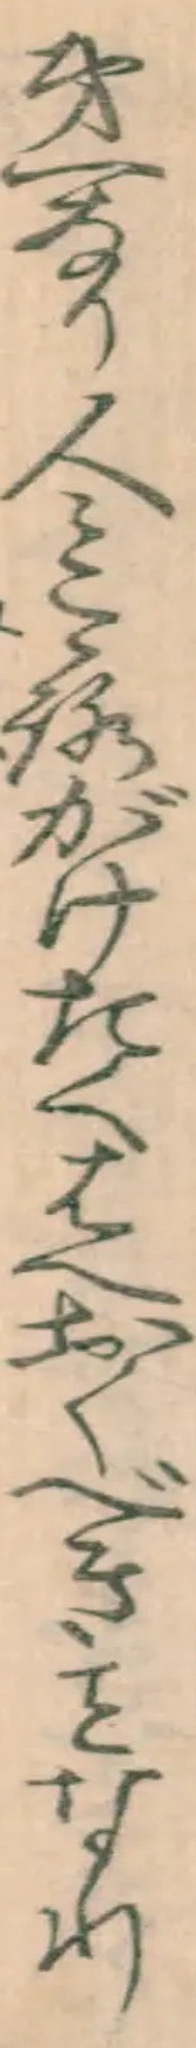第一なり人々こゝろがけたくはへおくべきことなり
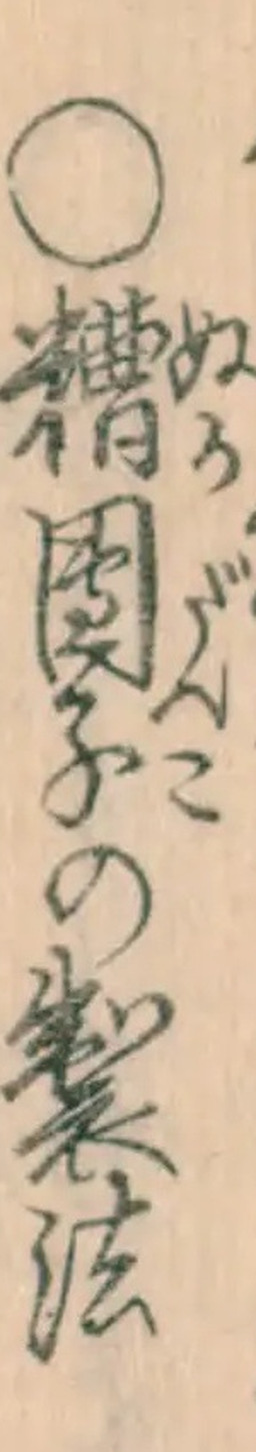○糟団子の製法
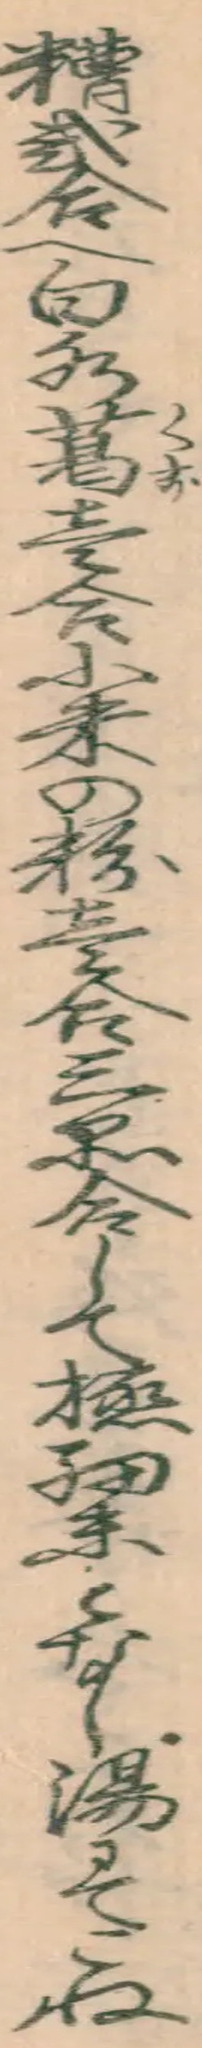糟弐合へ白水葛壱合小米の粉壱合三品合して極細末となし．湯にてこね
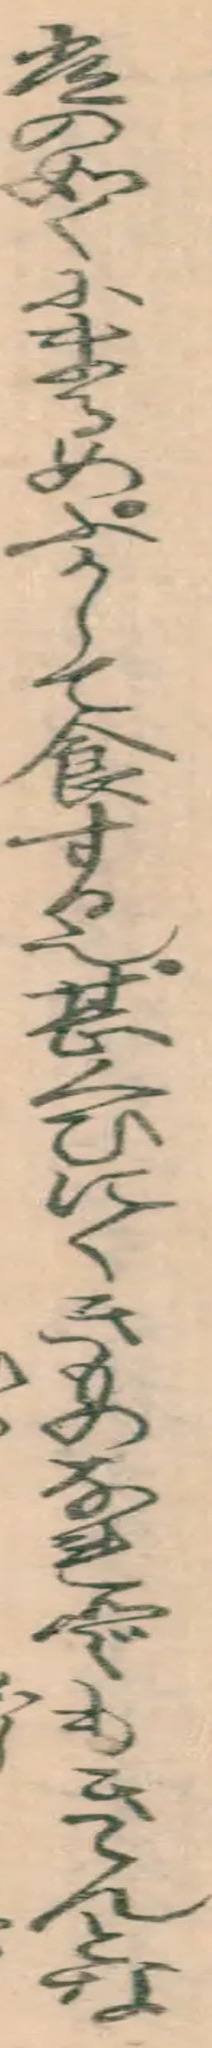常の如くにまるめ．ふかして食する也．甚くひにくきものなれどもきゝんとな
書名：日ごとの心得
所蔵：国立国会図書館 National Diet Library, JAPAN
